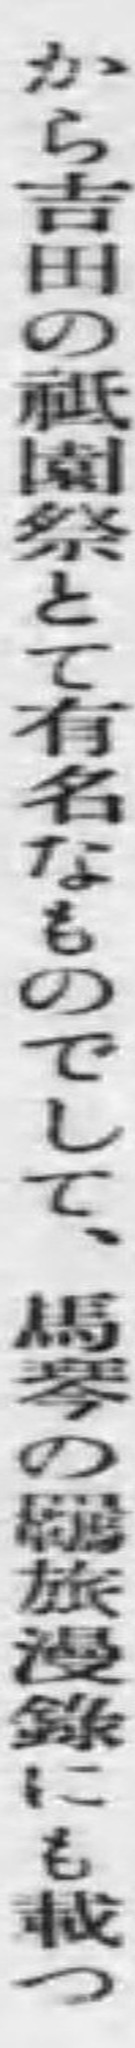から吉田の祗園祭とて有名なものでして、馬琴の羈旅漫録にも載つ
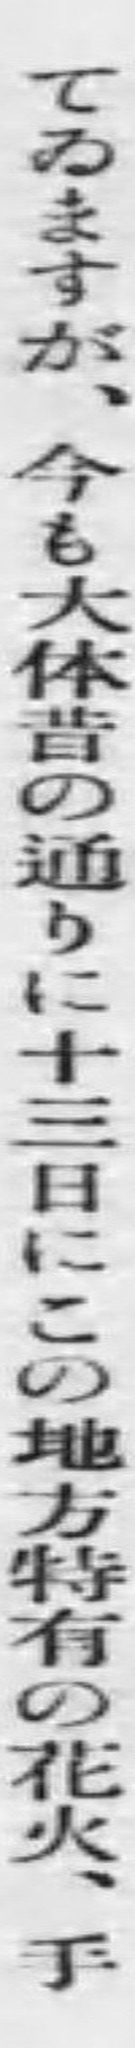てゐますが、今も大体昔の通りに十三日にこの地方特有の花火、手
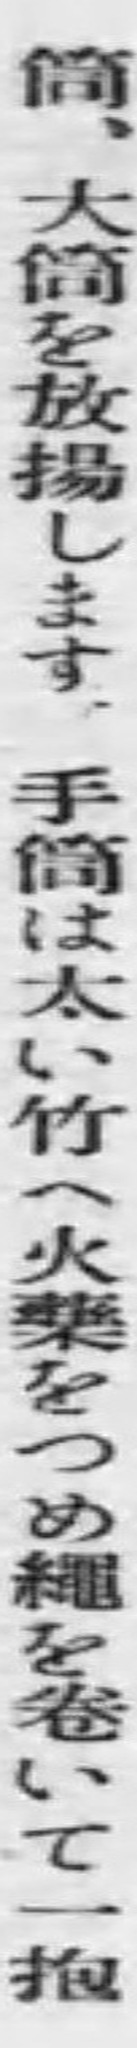筒、大筒を放揚します。手筒は太い竹へ火薬をつめ縄を巻いて一抱
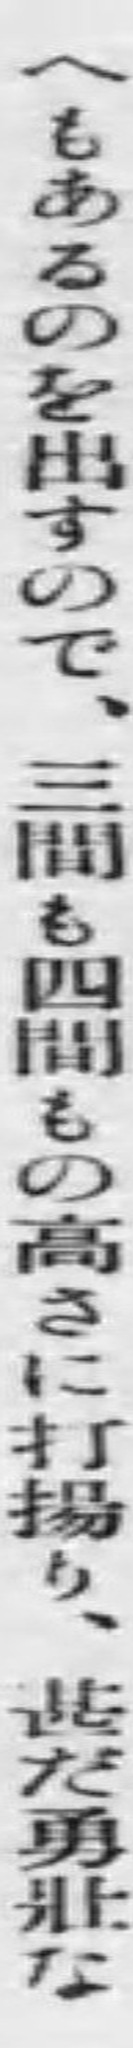へもあるのを出すので、三間も四間もの高さに打揚り、甚だ勇壮な
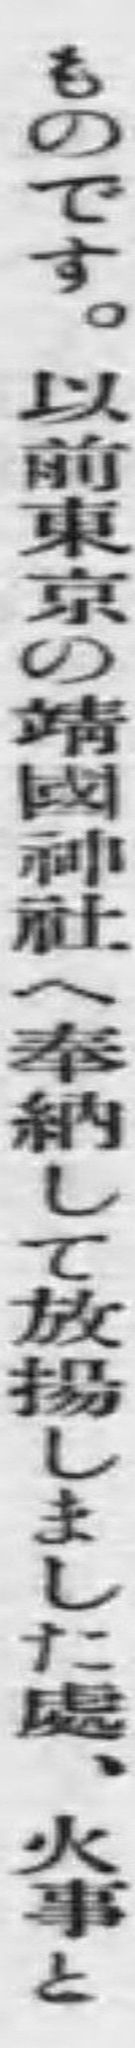ものです。以前東京の靖国神社へ奉納して放揚しました処、火事と
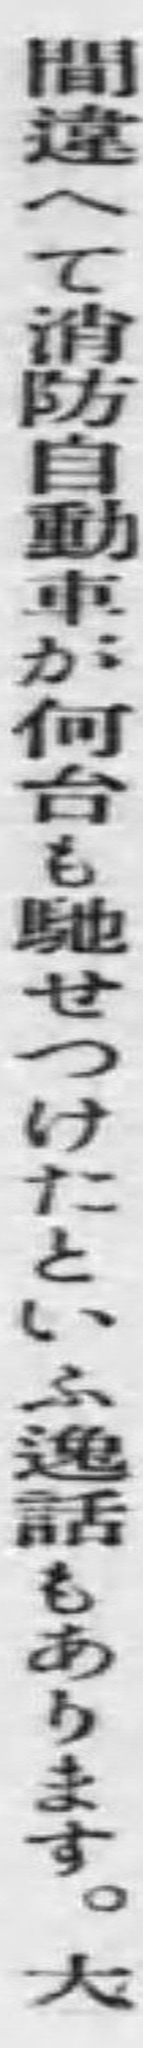間違へて消防自動車が何台も馳せつけたといふ逸話もあります。大
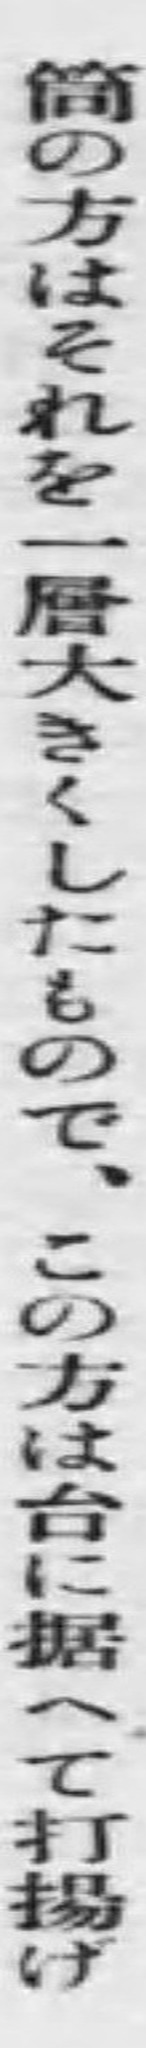筒の方はそれを一層大きくしたもので、この方は台に据へて打揚げ
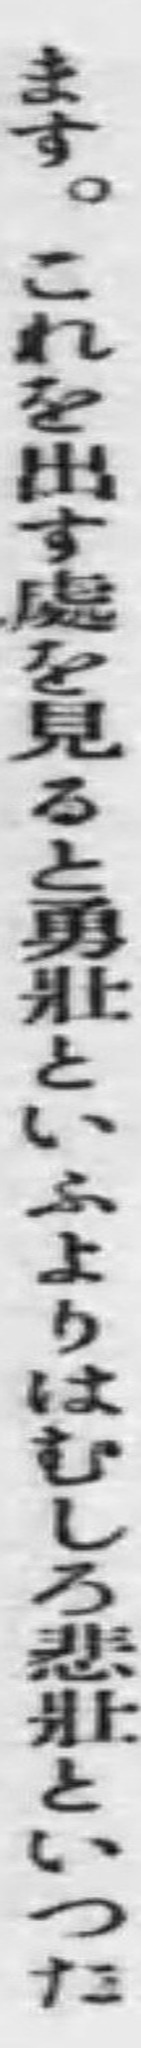ます。これを出す処を見ると勇壮といふよりはむしろ悲壮といつた
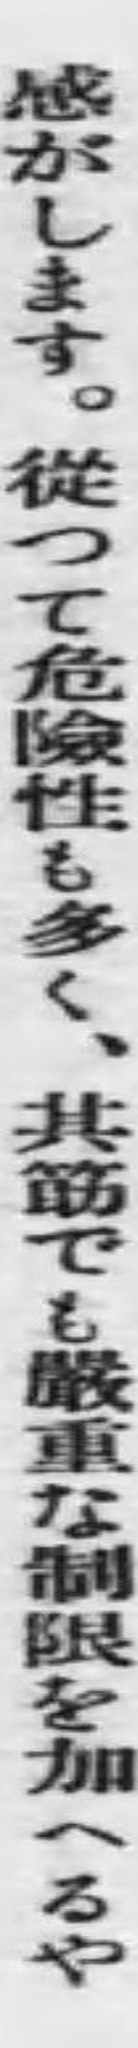感がします。従つて危険性も多く、其筋でも厳重な制限を加へるや
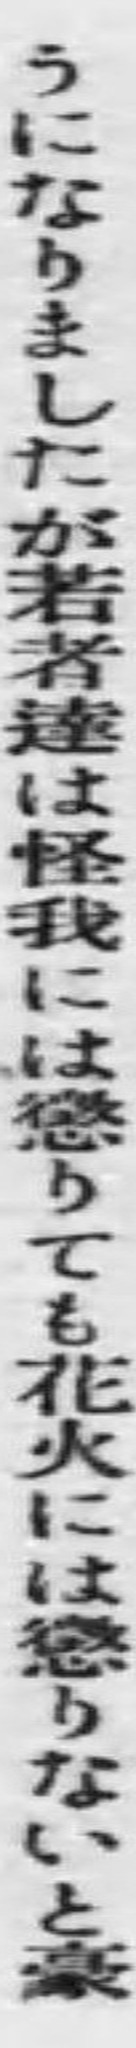うになりましたが若者達は怪我には懲りても花火には懲りないと豪
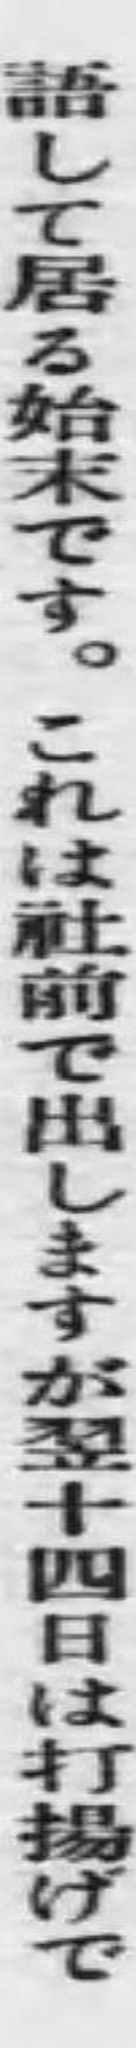語して居る始末です。これは社前で出しますが翌十四日は打揚げで
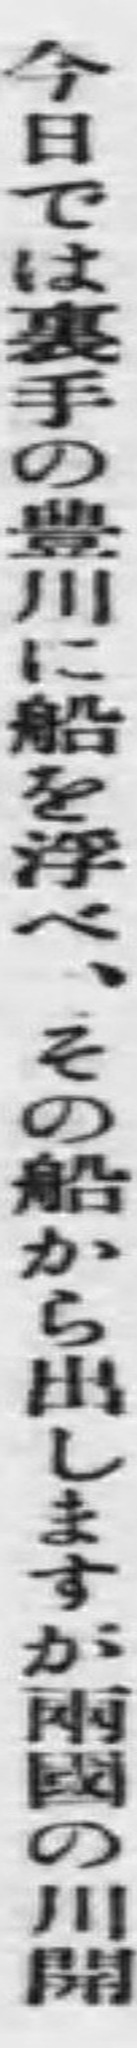今日では裏手の豊川に船を浮べ、その船から出しますが両国の川開
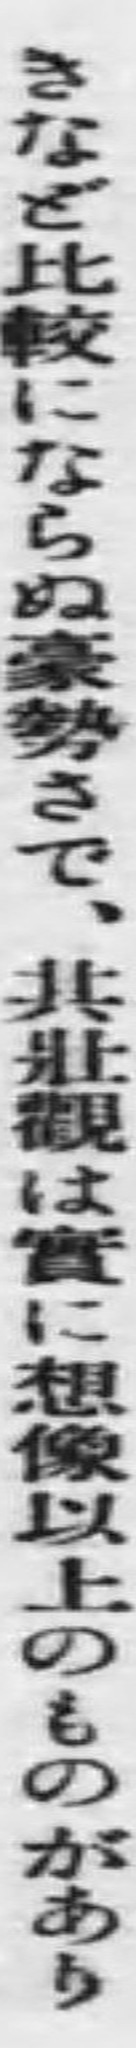きなど比較にならぬ豪勢さで、其壮観は実に想像以上のものがあり
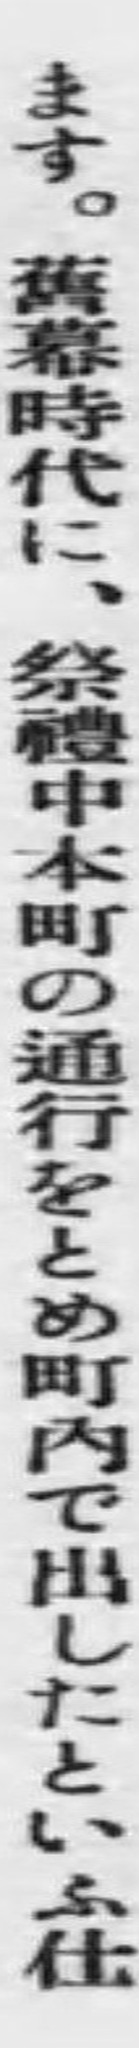ます。旧幕時代に、祭礼中本町の通行をとめ町内で出したといふ仕
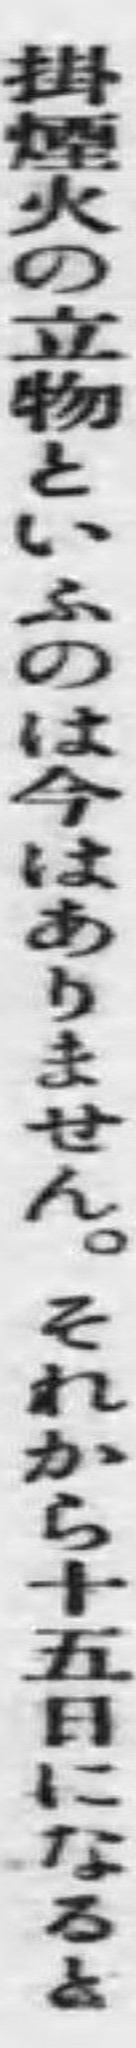掛煙火の立物といふのは今はありません。それから十五日になると
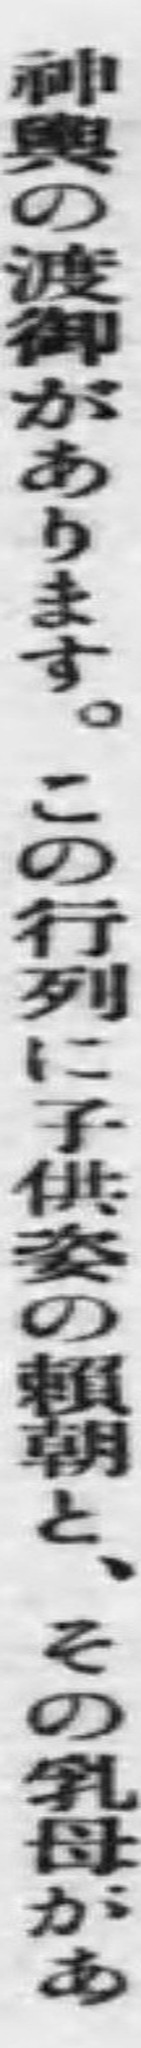神輿の渡御があります。この行列に子供姿の頼朝と、その乳母があ
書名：東三河道中記 : 豊橋市及其附近案内
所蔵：国立国会図書館 National Diet Library, JAPAN
